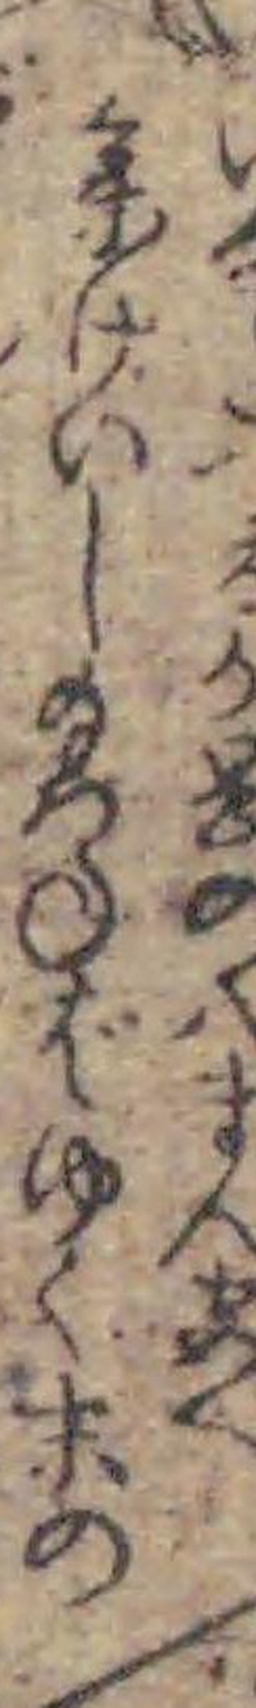参けいし給はねばゆく末の
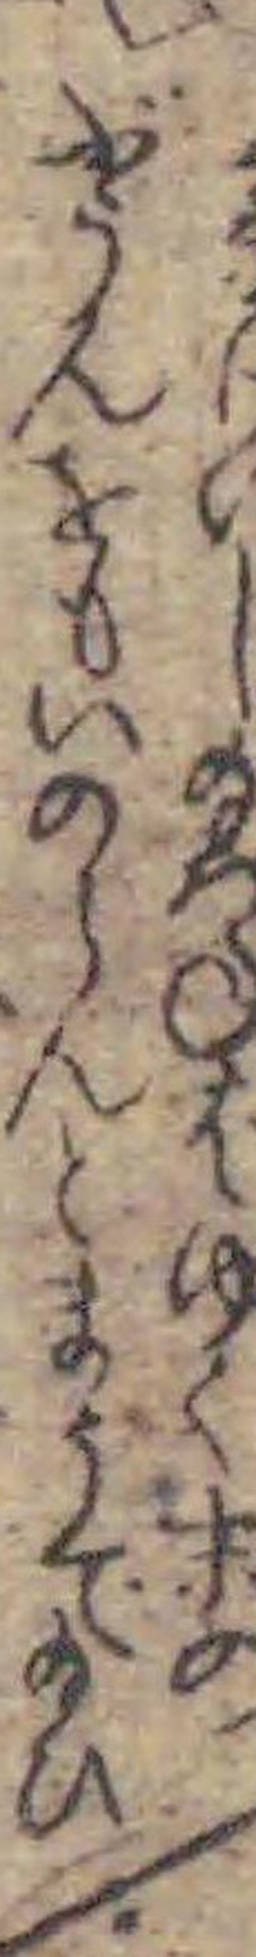ぶうんをもいのらんとまうで給ひ
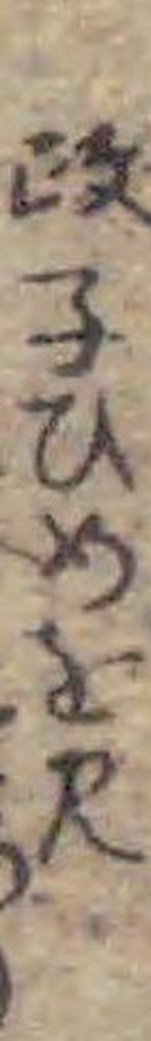政子ひめを見
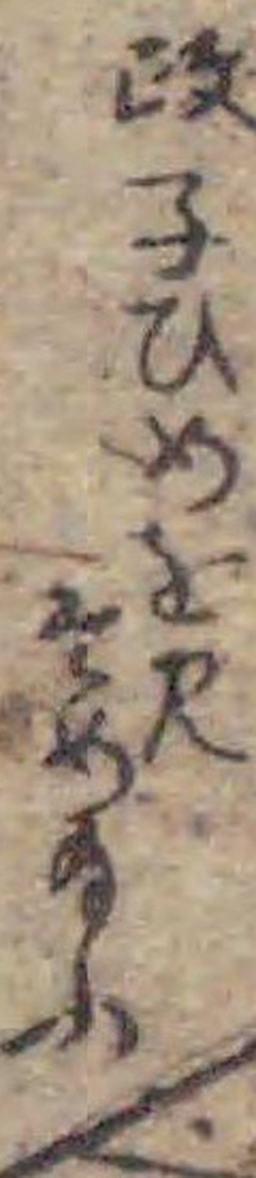そめ給ふ
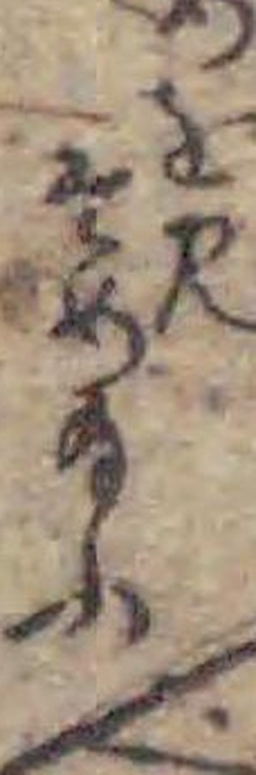そめ給ふ
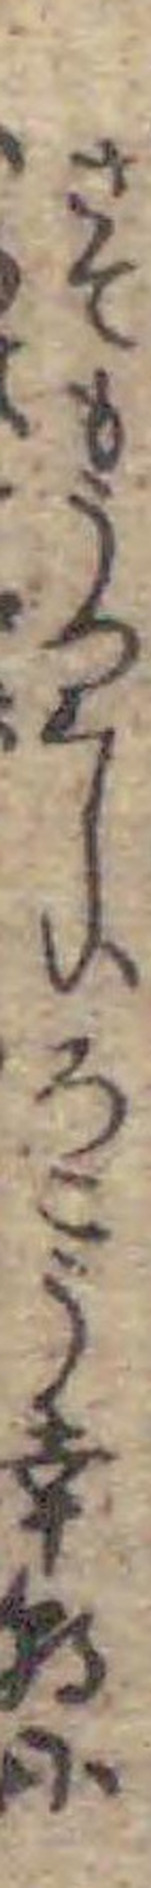さてもうつくしいろこう幸朝に
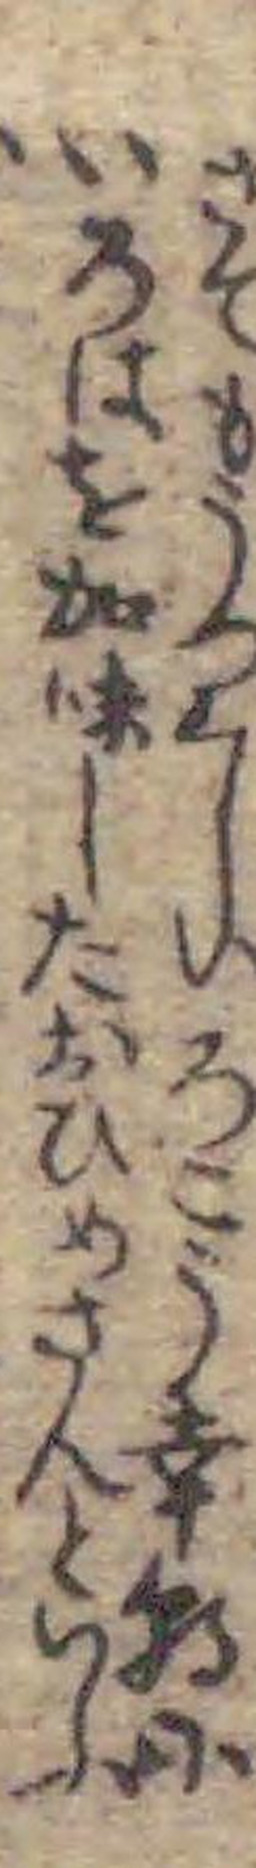いろはを加味したおひめさんといふ
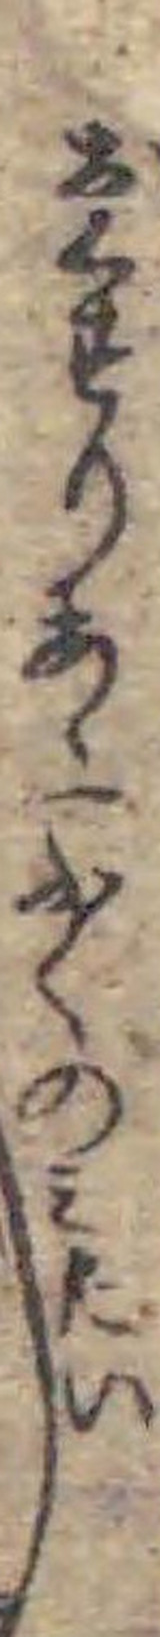おくすりあゝ一ふくのみたい
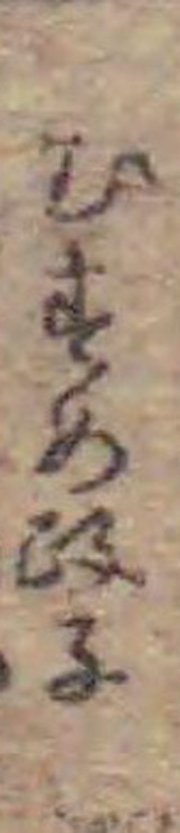むすめ政子
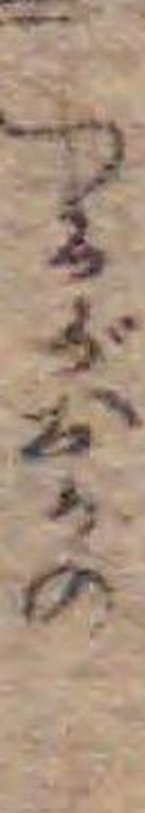つるがおかの
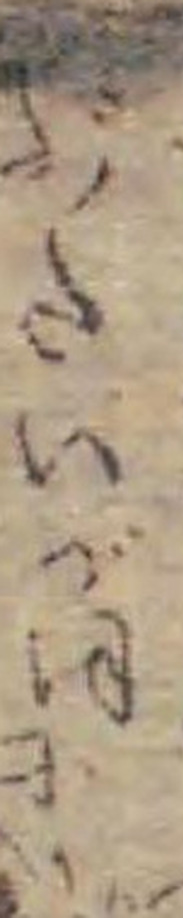ぶたいがほに
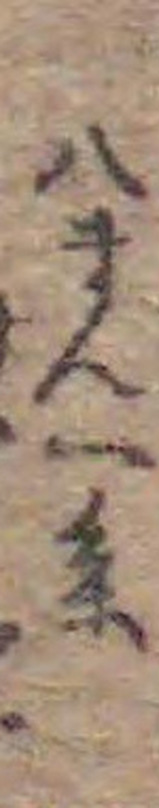八まんへ参
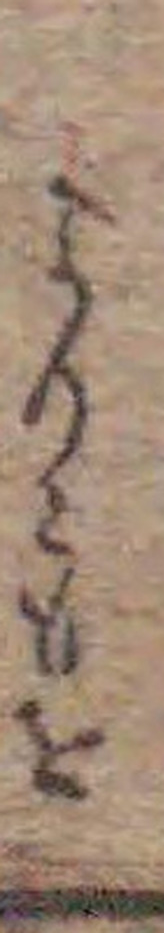よりともを
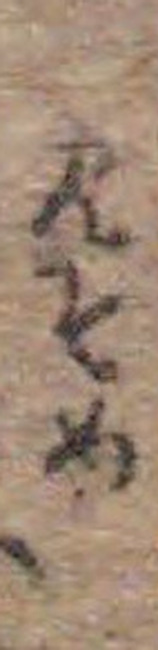見そめ
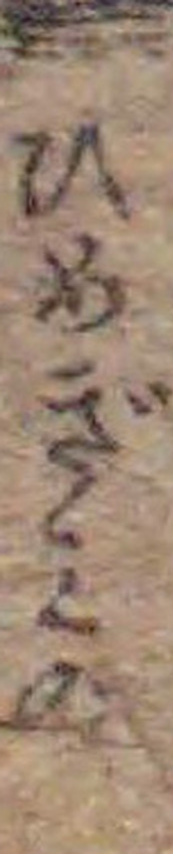ひめぎみの
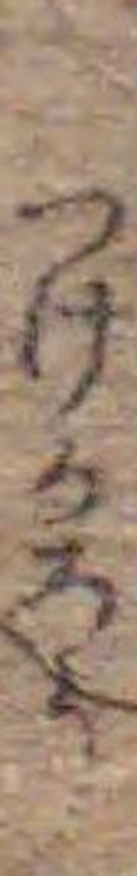つけがろう
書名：三舛増鱗組 : 3巻
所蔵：国立国会図書館 National Diet Library, JAPAN
